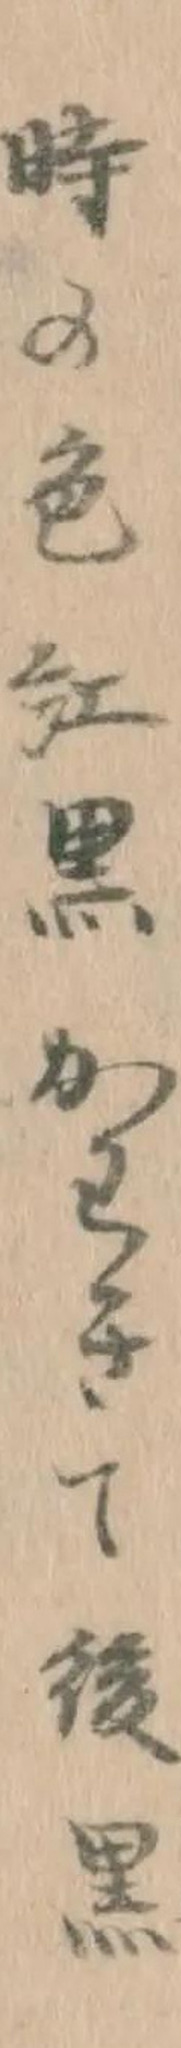時の色紅黒かわきて後黒
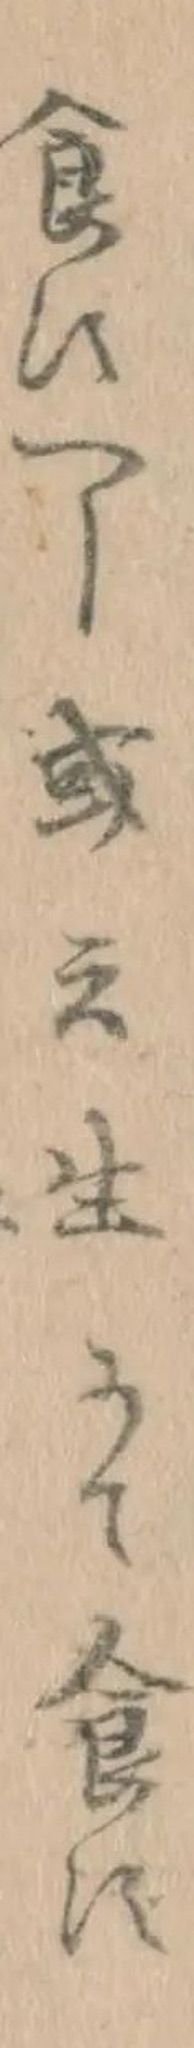食すへし或云生にて食す
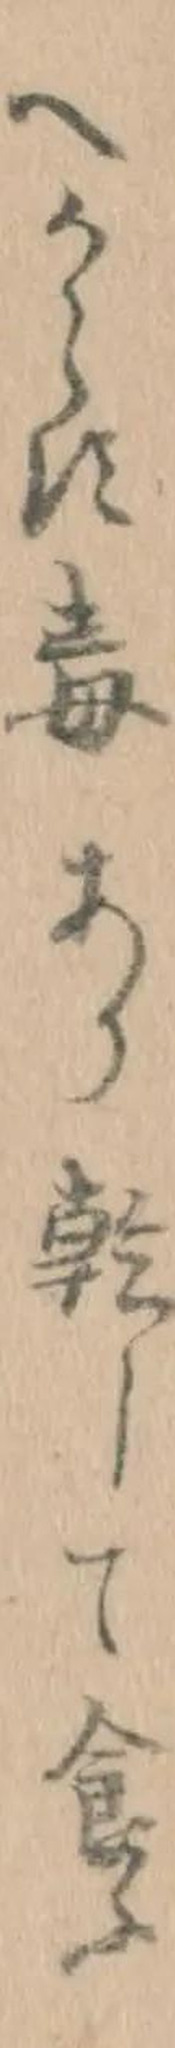へからす毒あり乾して食ふ
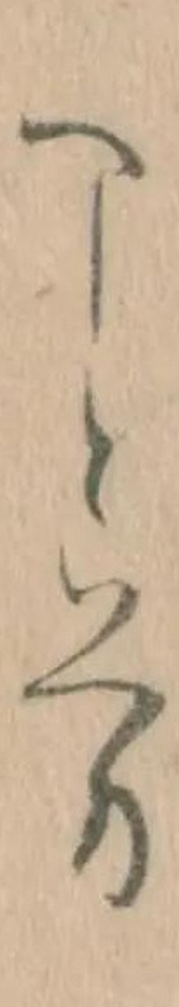へしといへり

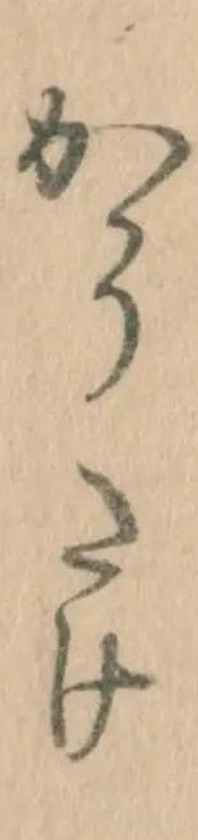かうたけ
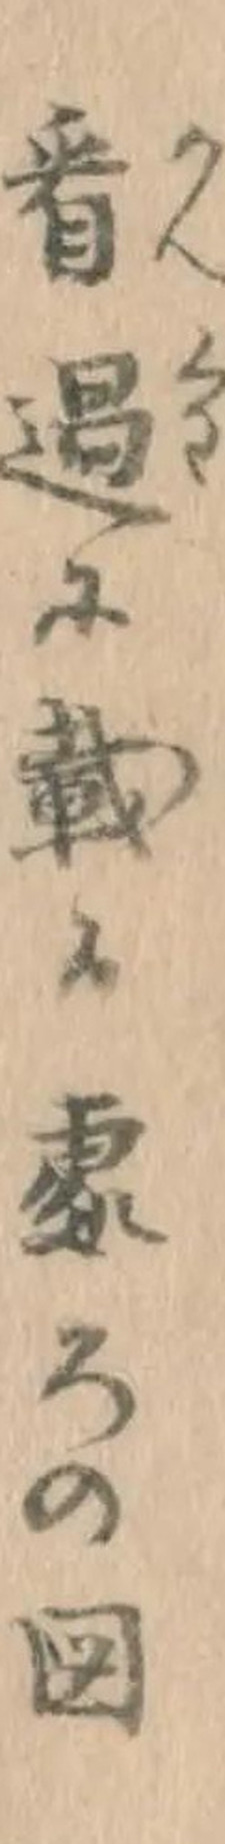看過に載る処ろの図
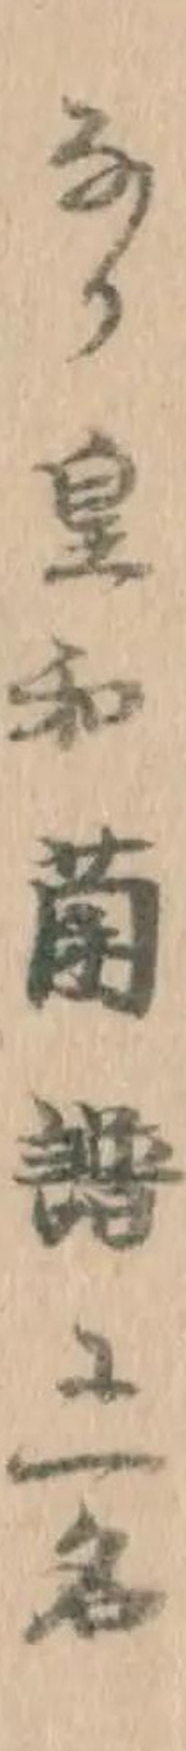なり皇和菌譜に一名
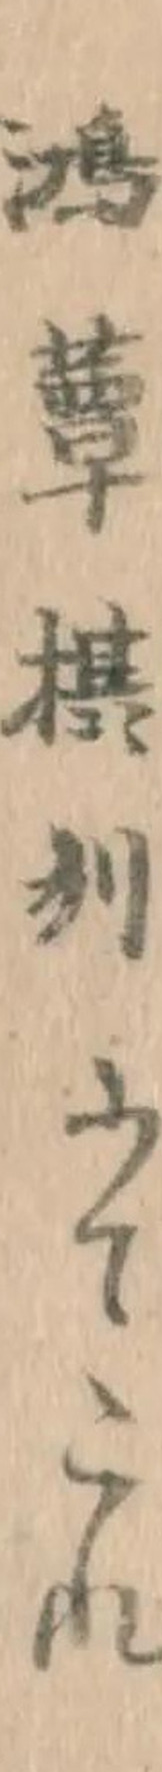鴻蕈摂州にてこれ
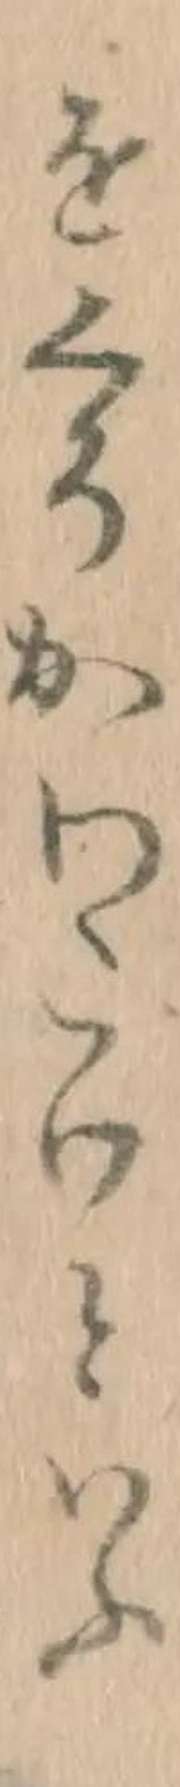をくろかわたけといふ
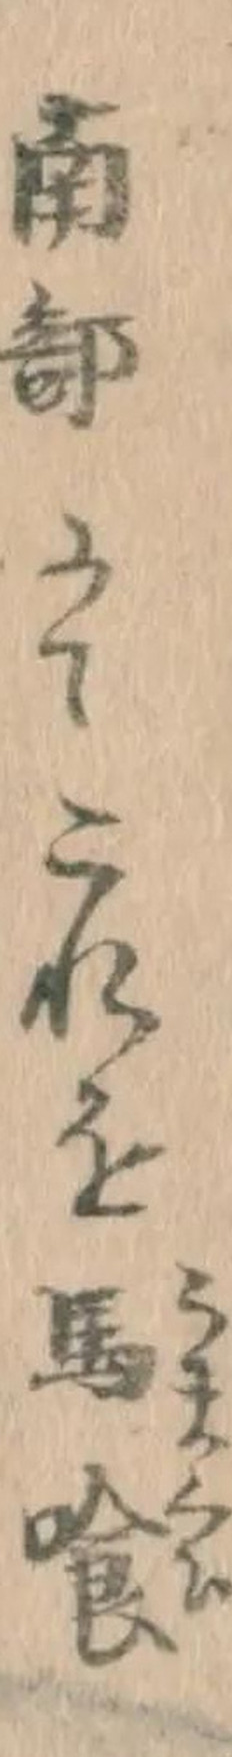南部にてこれを馬喰
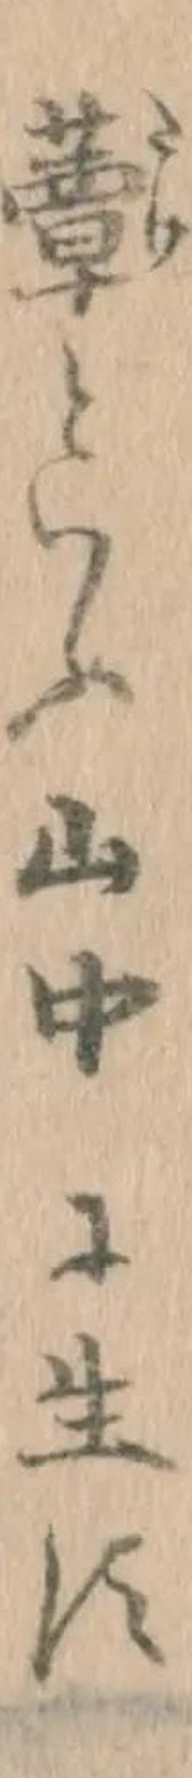蕈といふ山中に生す
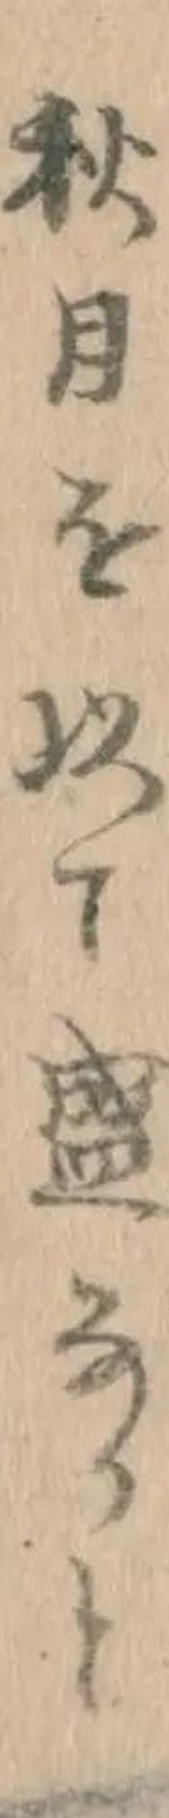秋月を以て盛なりと
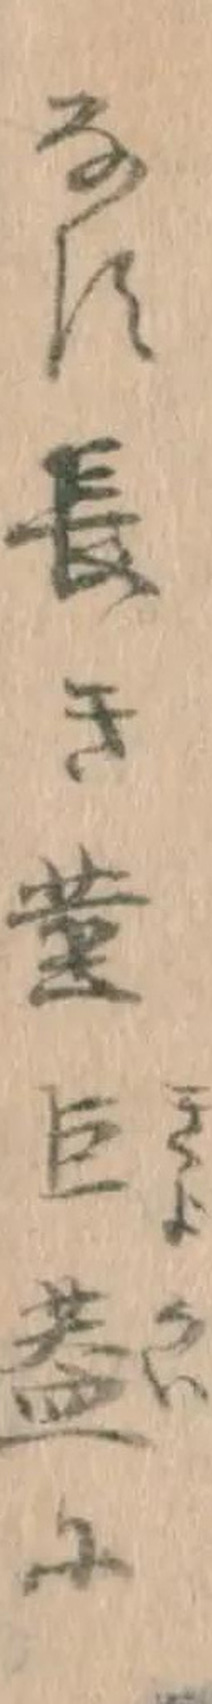なす長き茎巨蓋に
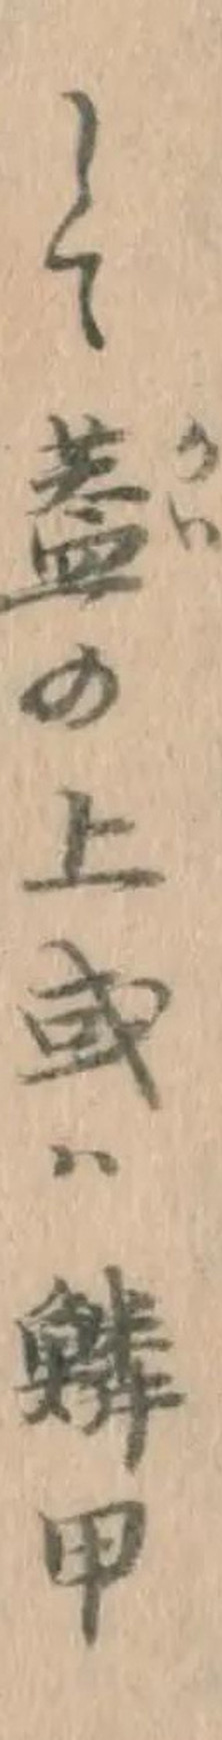して蓋の上或は鱗甲
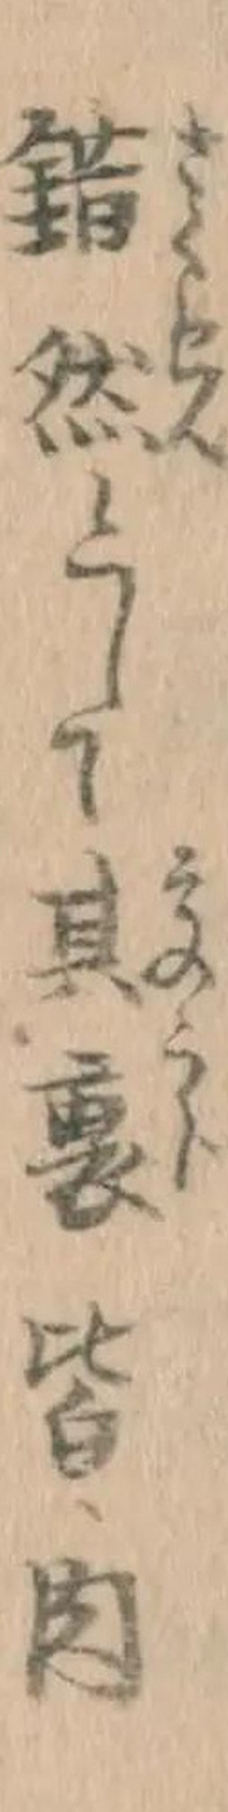錯然として其裏皆肉
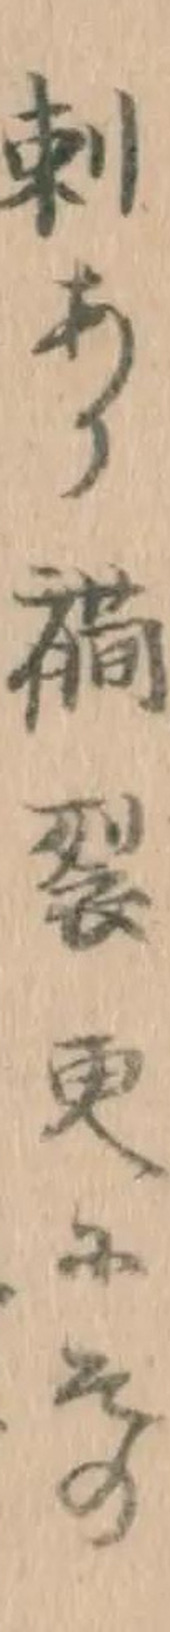剌あり裂更にその
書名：本草図譜. 巻55-57
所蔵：国立国会図書館 National Diet Library, JAPAN
